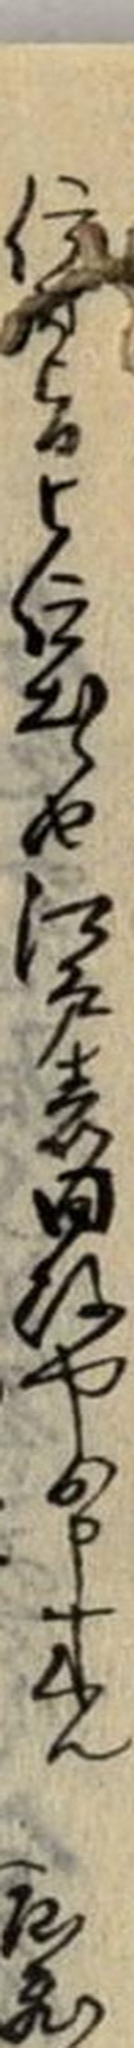仰付候旨被仰出候由江戸表同役中ゟ申来ル
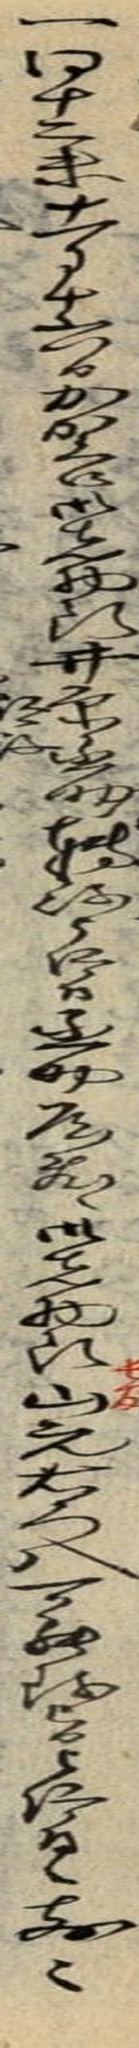一同十二未十一月十六日加賀口御先物頭井原丞助屋敷奉行転役被仰付丞助屋敷へ御先物頭長官？山元右衛門八可罷越旨被仰付候前々
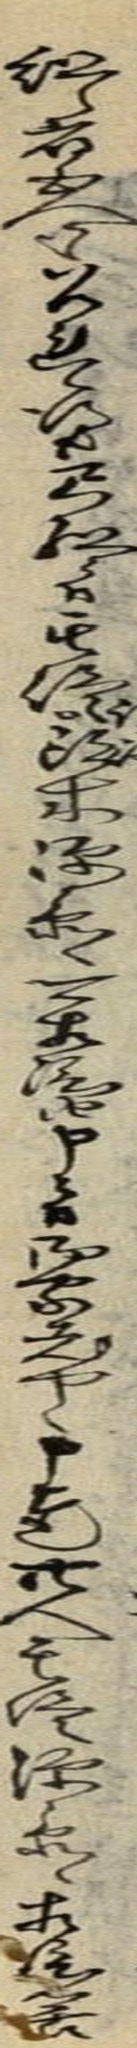組之者五人つゝ召連候得共弓組に付其侭跡役鈴木源兵衛へ可相渡由申候に付御家老中へ申達廿人其侭源兵衛へ相渡候筈
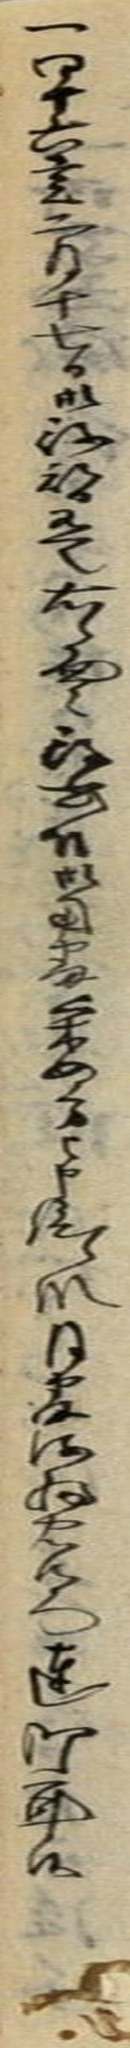一同十六亥二月十七日御役替有之右之面々へ役書付御用番采女方被申渡候段月番海福忠左衛門達御耳候
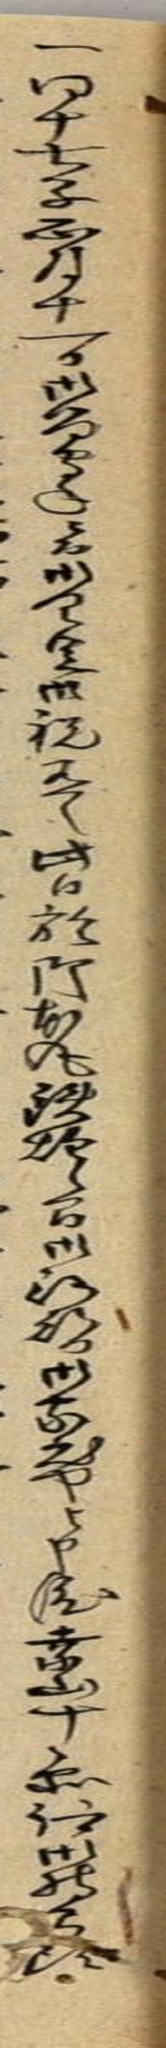一同十七子正月十一日御留守年に而御具足御祝有之此日於御本丸鉄炮之間役替御家老中被申渡桑山十兵衛跡御持弓頭
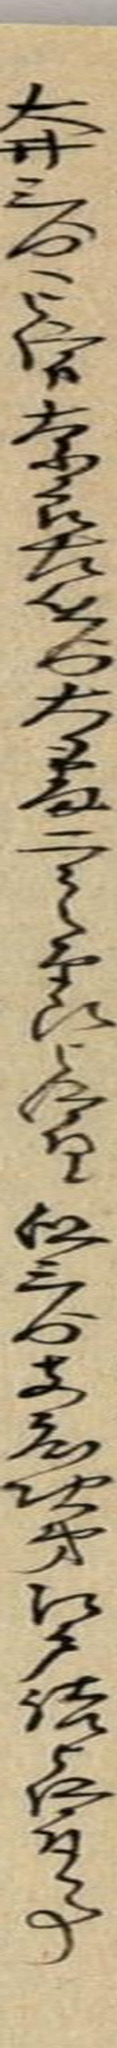大井三右衛門へ被仰付奈良左近右衛門大御番二同之筆頭被仰付候但三右衛門支度次第江戸詰被仰付候事
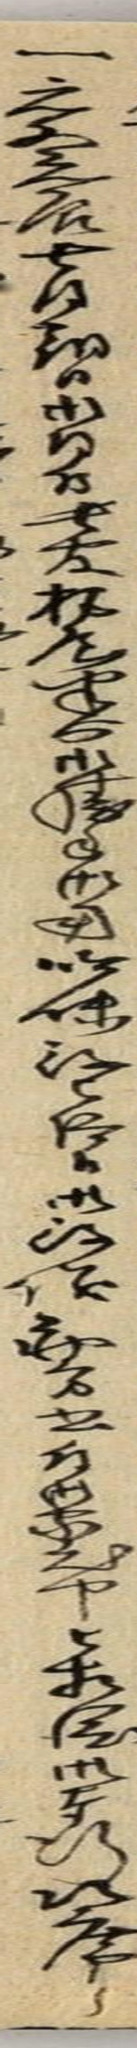一元文元辰七月朔日御目付長官栃屋半右衛門御勝手御用吟味役被仰付御役儀勤方書付御家老中被相渡御奉行次席
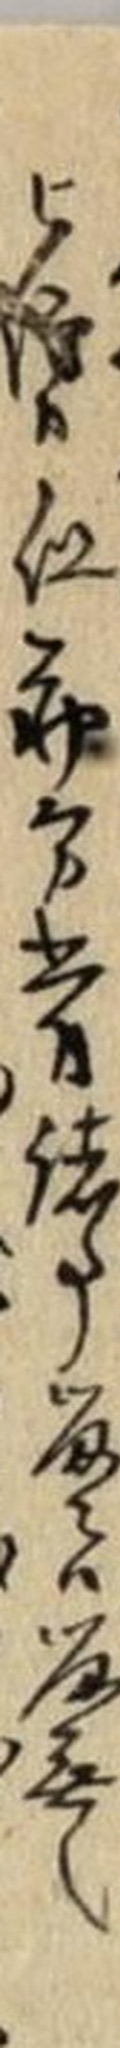被仰付但勤方書付諸事留には留無之
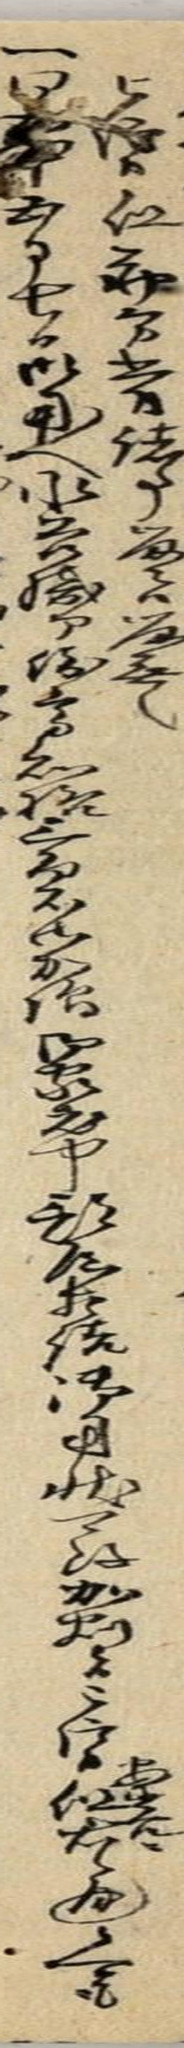一同元文五申五月七日御用人水谷織部儀高知格三百石御加増御家老中部屋相詰御用状可致加判旨被仰付但案するに右之通に候へとも
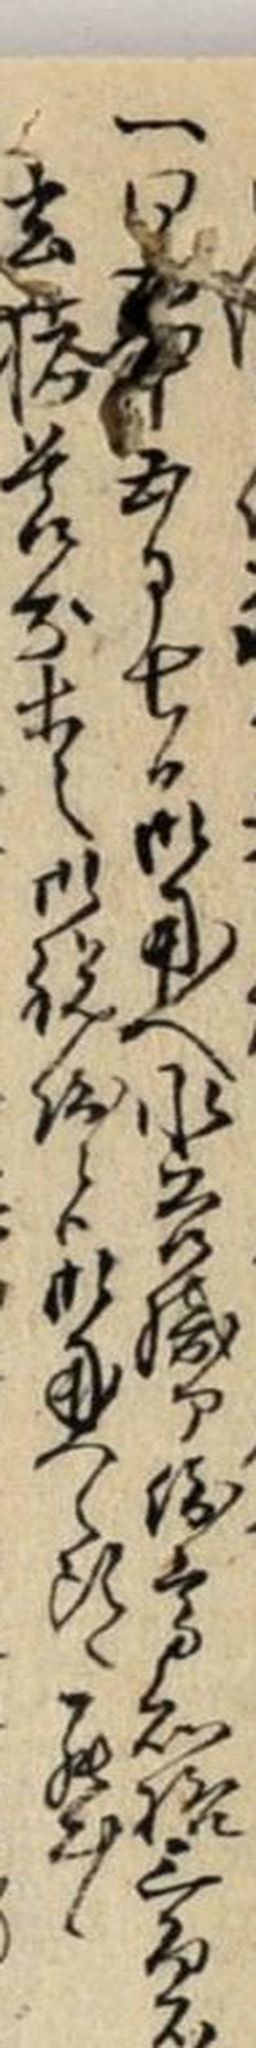玄猪節分等之御祝儀には御用人之頭へ罷出候
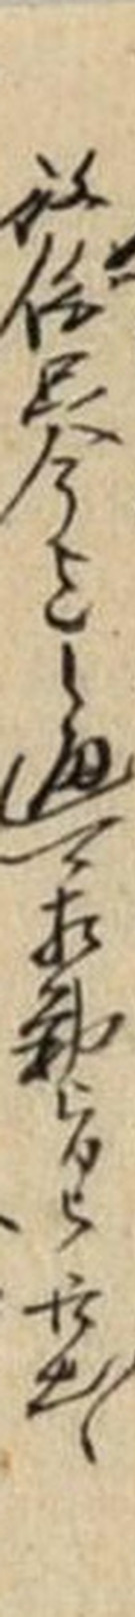役儀只今迄之通可相勤旨被仰出候
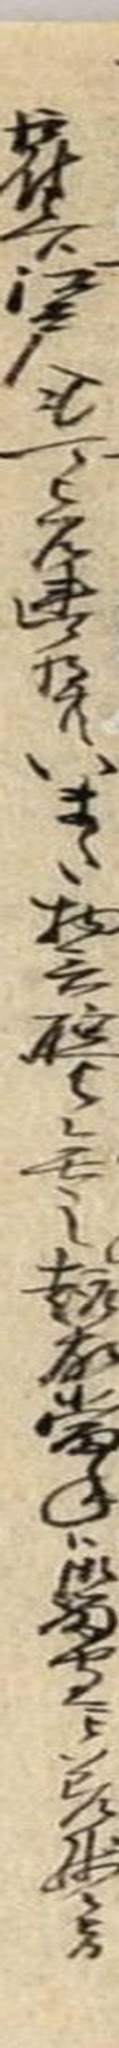仰付候へは江戸へも可被召連候得共いまた物言聢とは無之趣故当年は御留守に被差残候旨

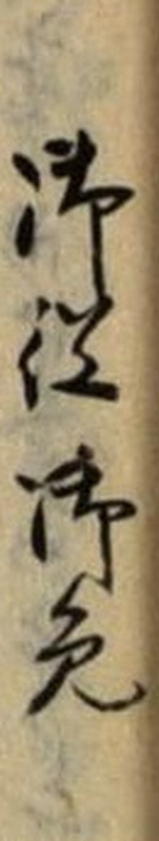御役御免
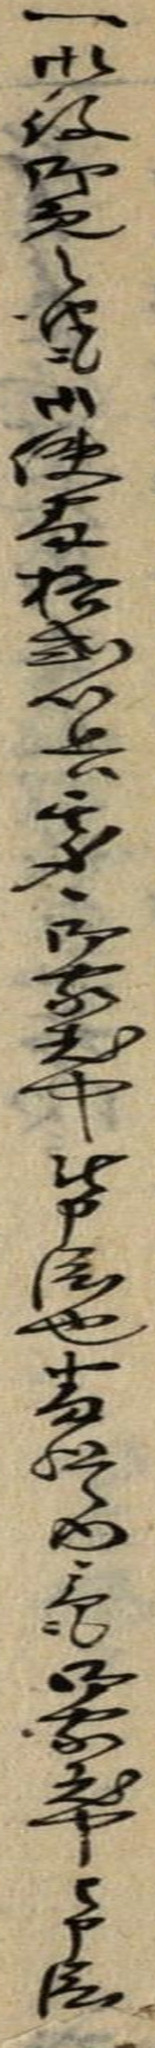一御役御免之儀も御使番格式以上は其身へ御家老中被申渡候也番組之内に而も御家老中被申渡
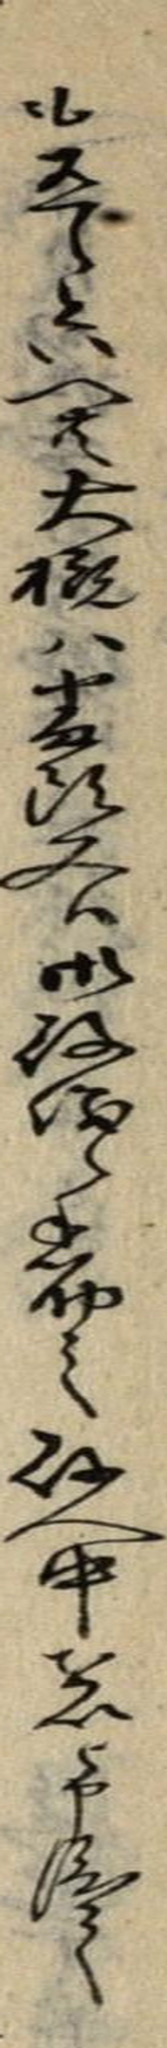も有之といへ共大概は番頭又は御役儀之手筋之役人中を以被申渡之
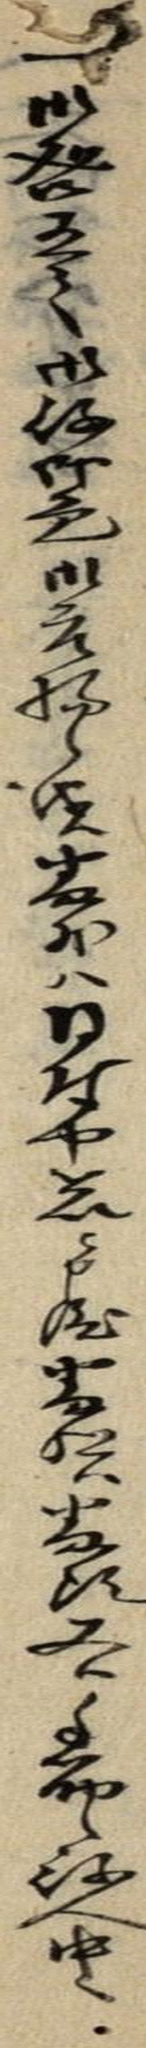一御咎有之御役御免御取揚之儀は番外は目付中を以被申渡番組は番頭又は手筋之役人中へ
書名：御用并被仰出之部
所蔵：福井県文書館 Fukui Prefectural Archives
